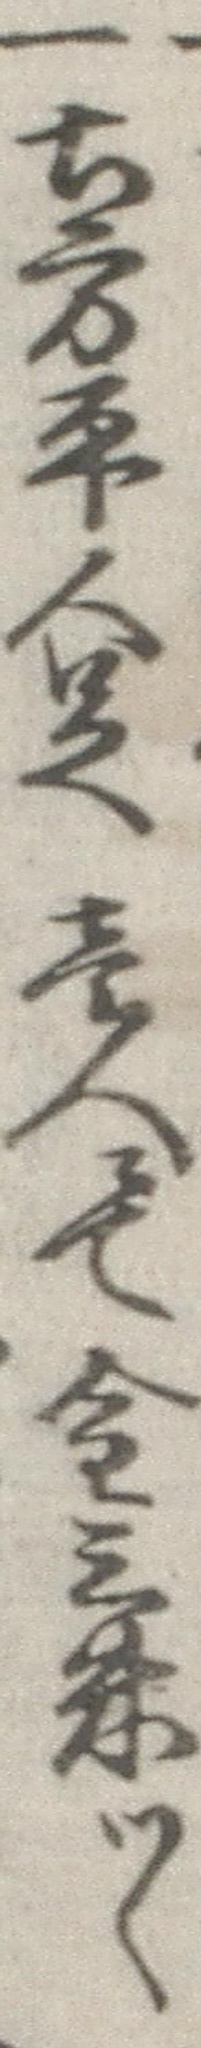一土方平人足壱人にて金三朱ツヽ
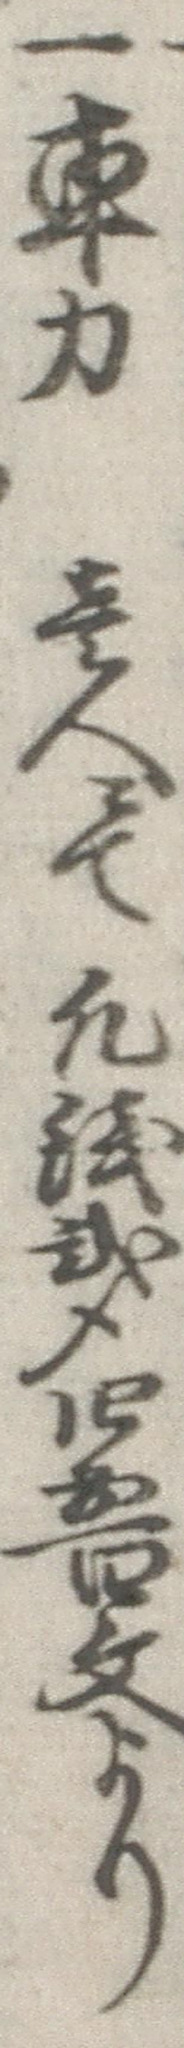一車力壱人にて凡銭弐貫四五百文より
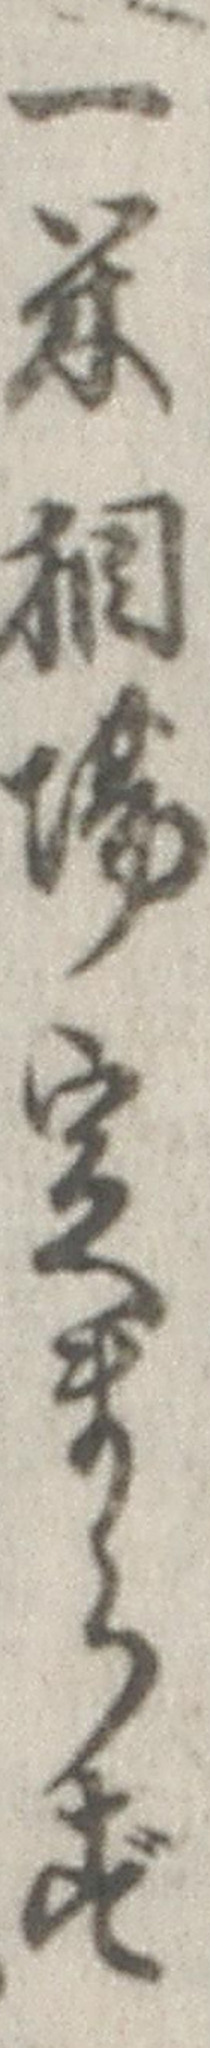一米相場定まらず
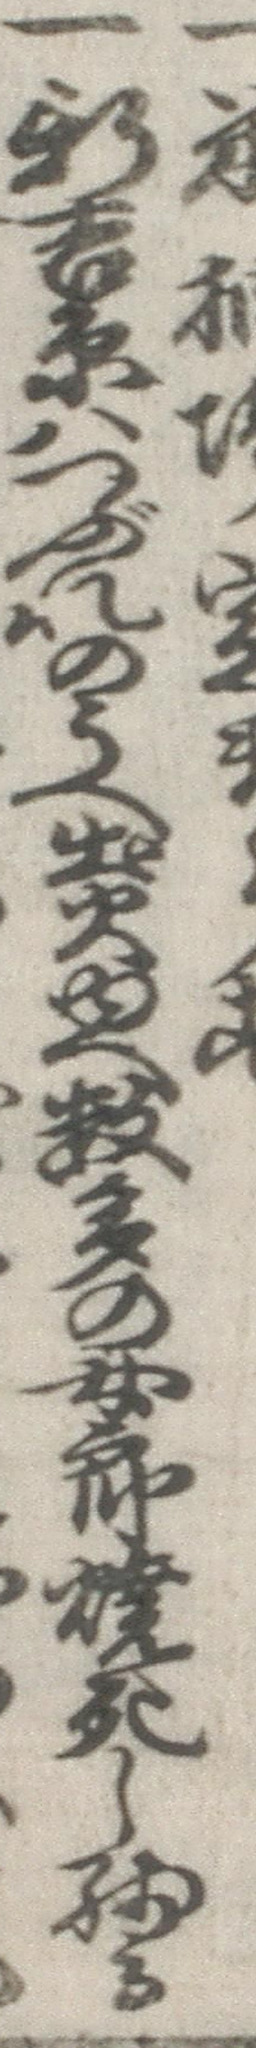一新吉原はつぶれのうへ出火ゆへ数多の女郎焼死し残る
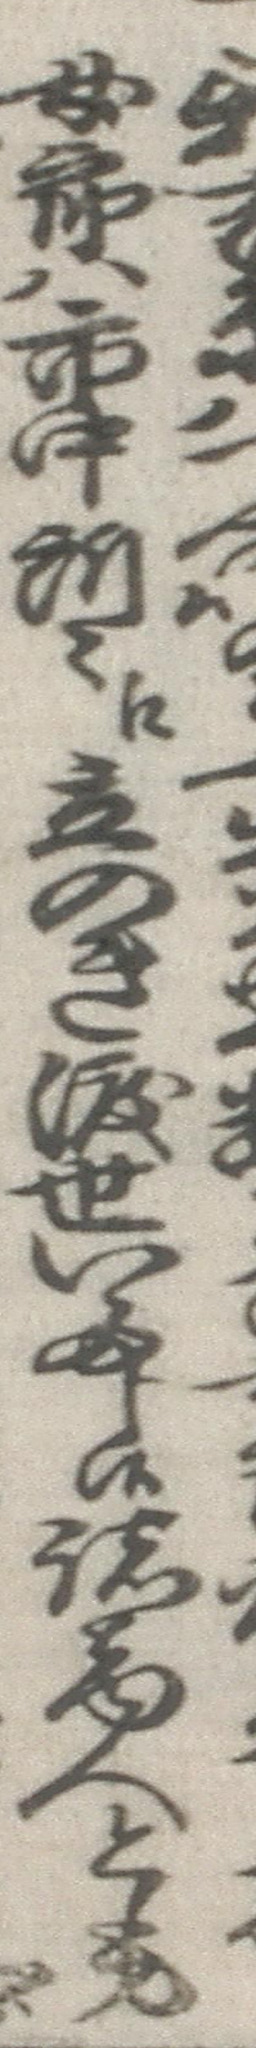女郎は市中所〻江立のき渡世いたし候諸商人とも
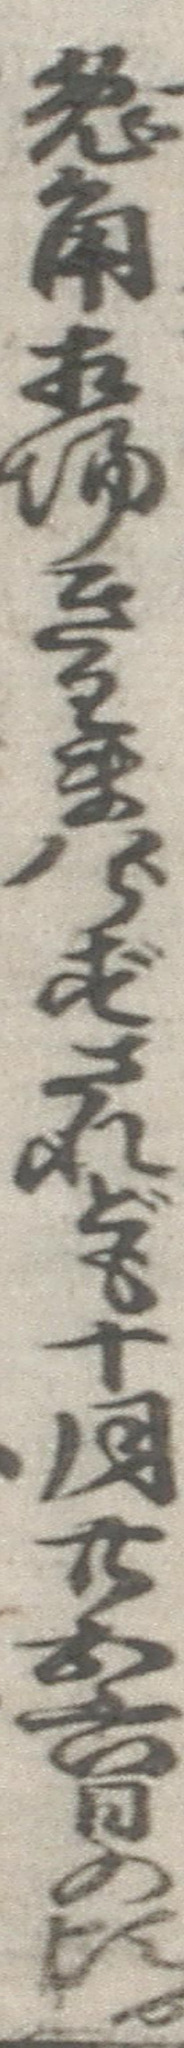兎角相場きわまらずされども十月廿五六日の頃ゟ
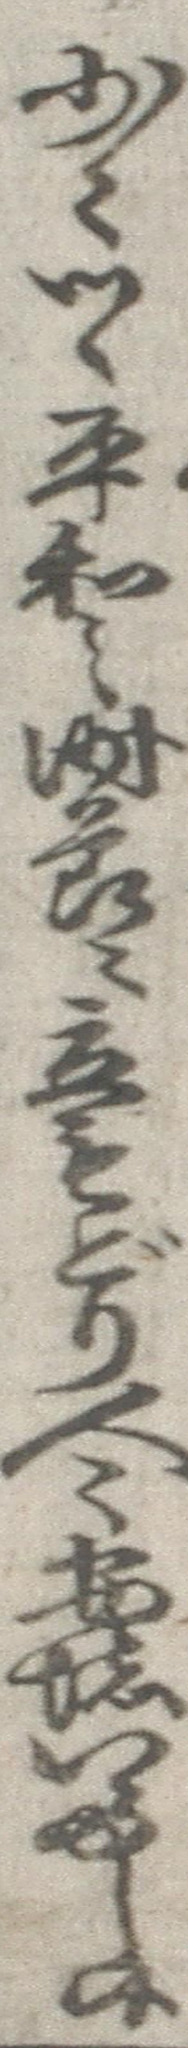少〻ツヽ平和之時節に立もどり人〻安堵致し候
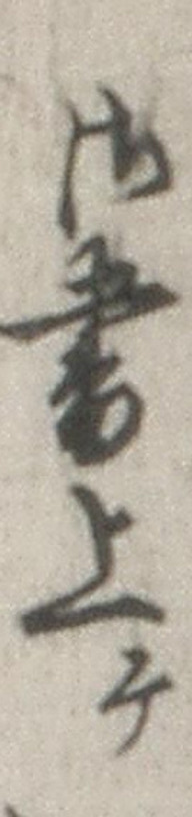御書上ケ
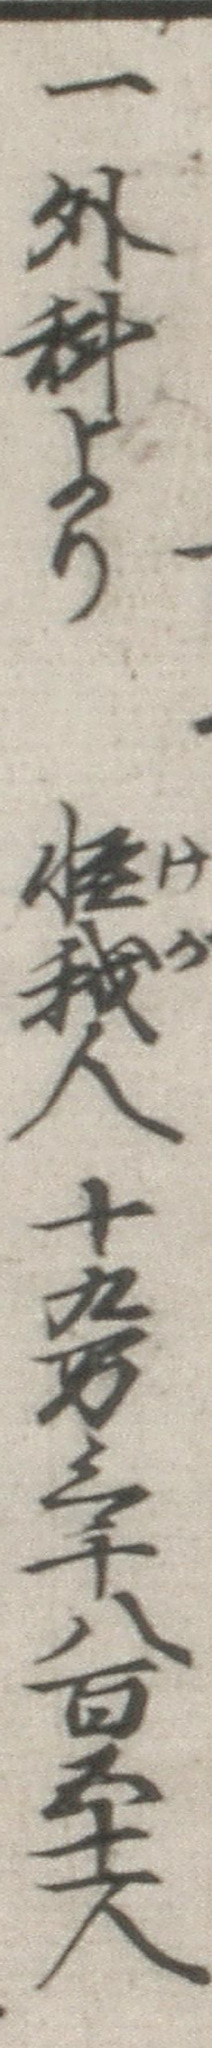一外科より怪我人十九万三千八百五十一人
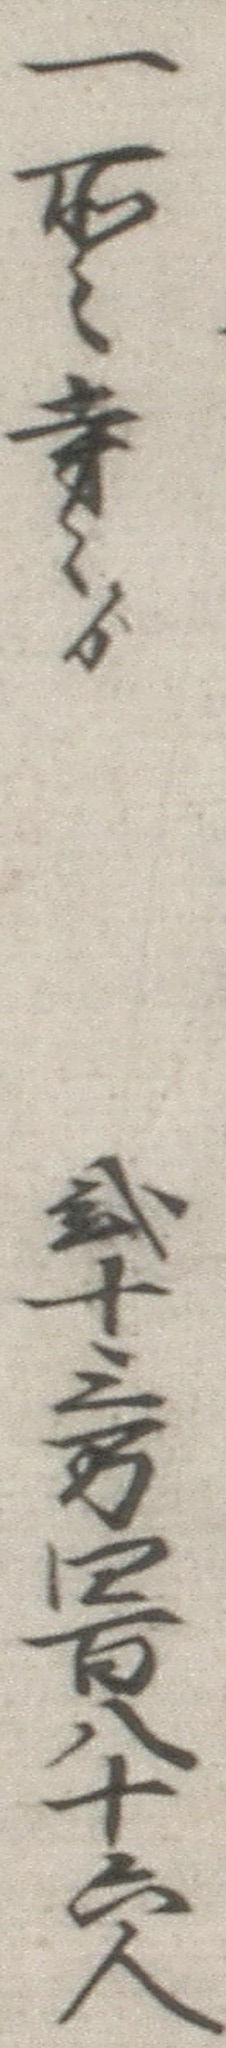一所〻寺〻ゟ弐十三万四百八十六人
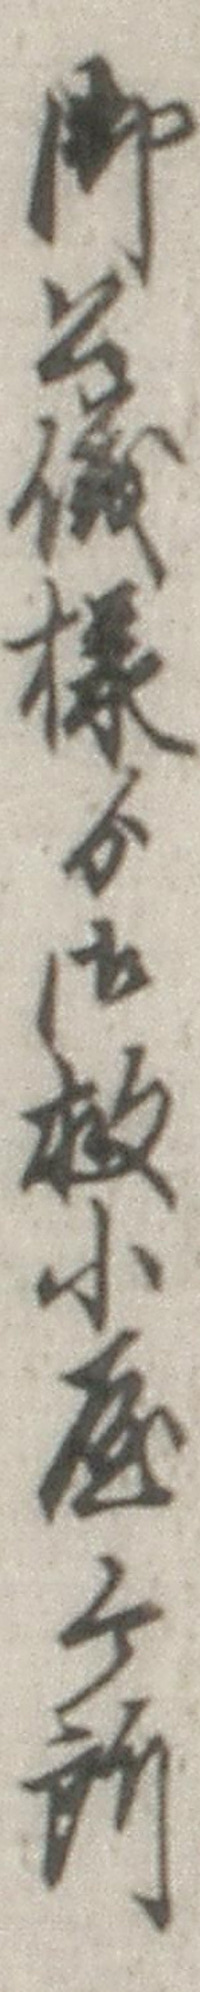御公儀様ゟ御救小屋ケ所
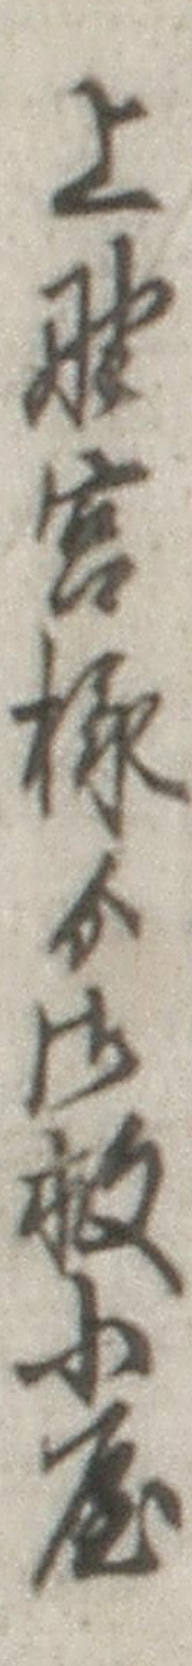上野宮様ゟ御救小屋
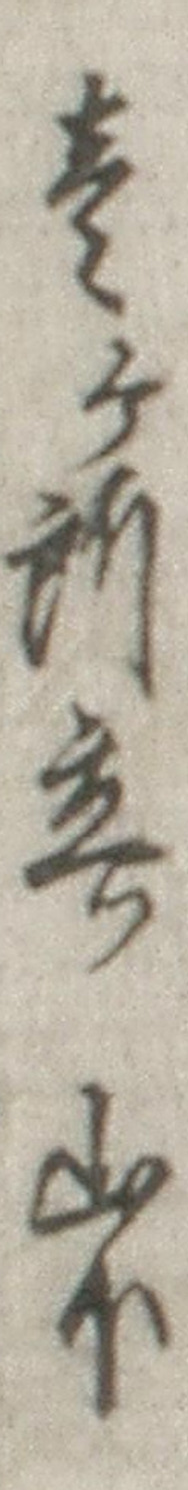壱ケ所立ツ山下
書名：大地震焼場細見記
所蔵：東京大学地震研究所図書室 Earthquake Research Institute Library, The University of Tokyo, JAPAN
